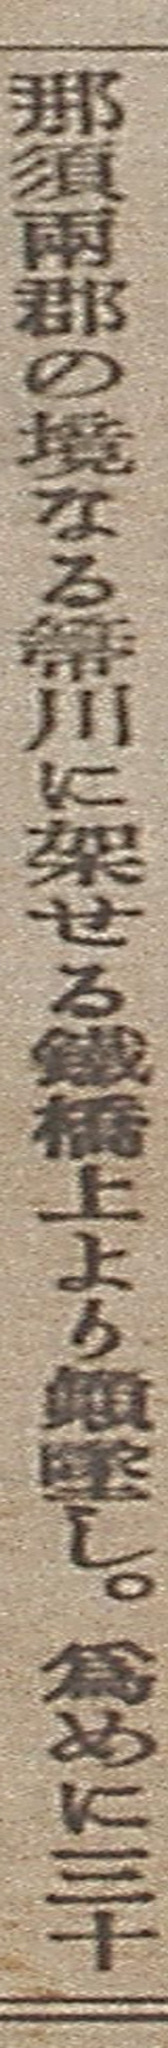那須両郡の境なる箒川に架せる鉄橋上より顛墜し。為めに三十
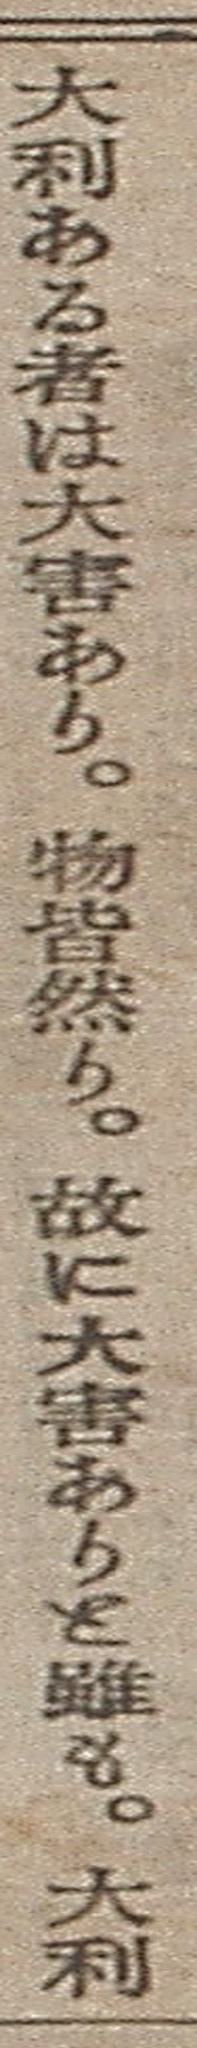大利ある者は大害あり。物皆然り。故に大害ありと雖も。大利
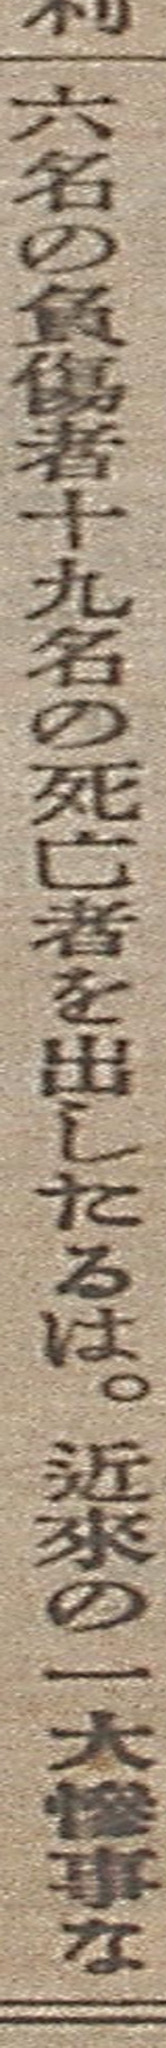六名の負傷者十九名の死亡者を出したるは。近来の一大惨事な
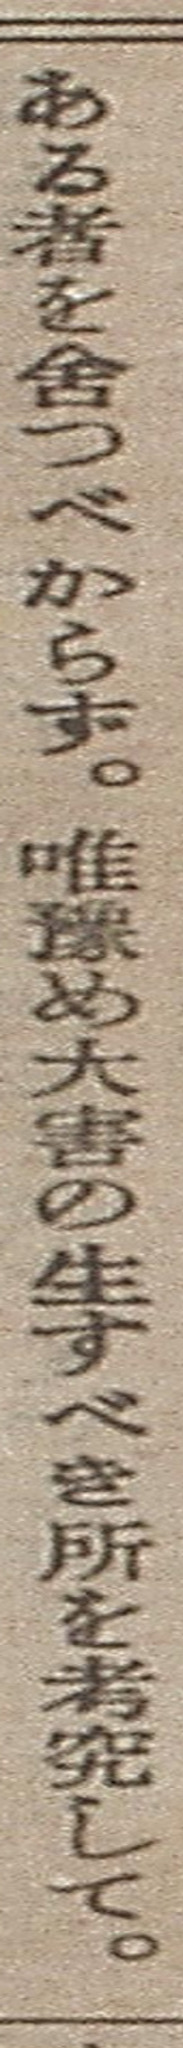ある者を舎つべからず。唯予め大害の生ずべき所を考究して。
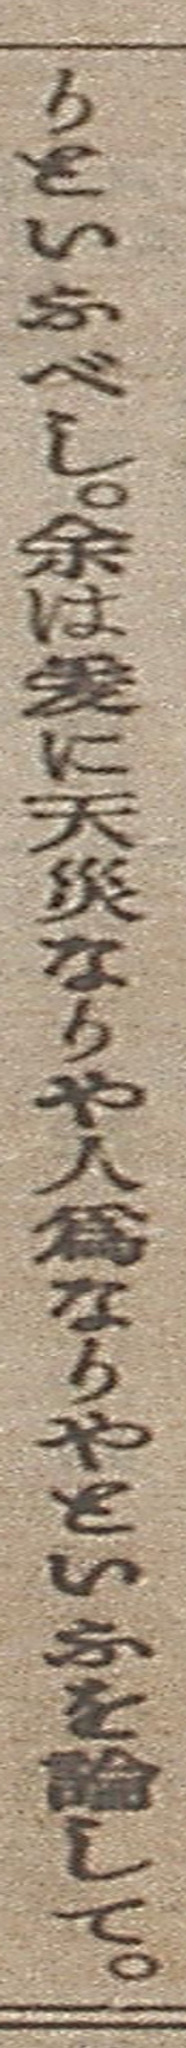りといふべし。余は爰に天災なりや人為なりやといふを論して。
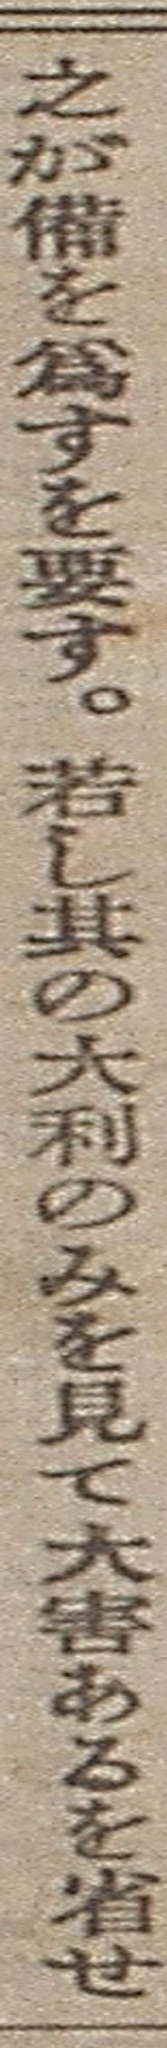之が備を為すを要す。若し其の大利のみを見て大害あるを省せ
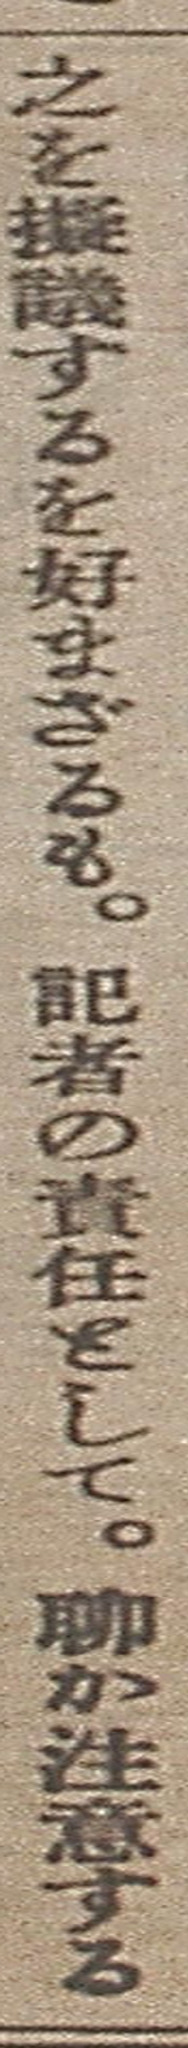之を擬議するを好まざるも。記者の責任として。聊か注意する
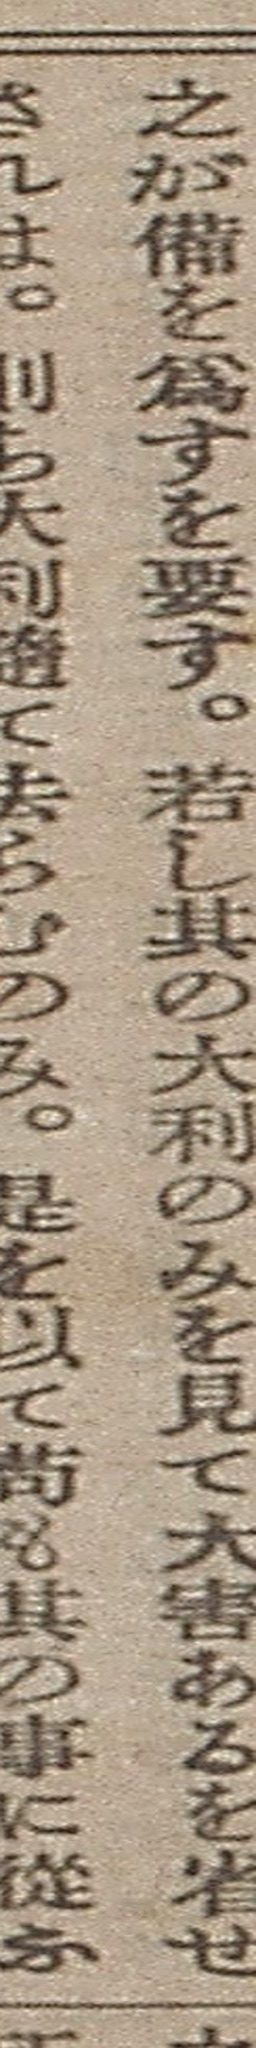されは。則ち大利随て去らむのみ。是を以て苟も其の事に従ふ
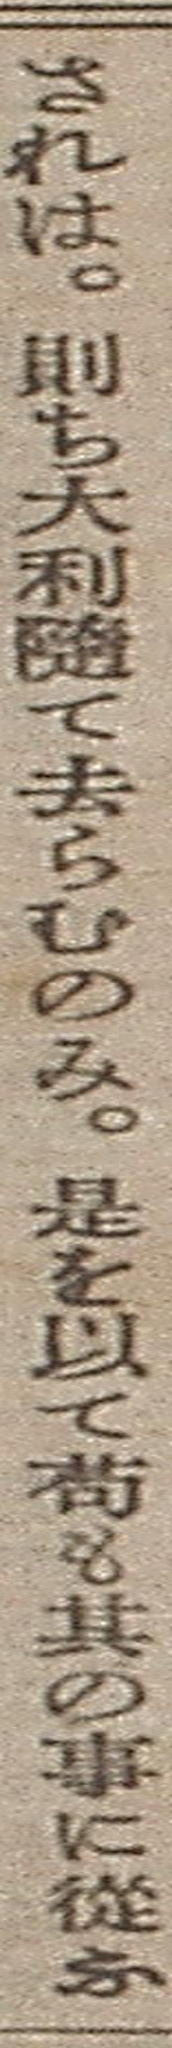されは。則ち大利随て去らむのみ。是を以て苟も其の事に従ふ
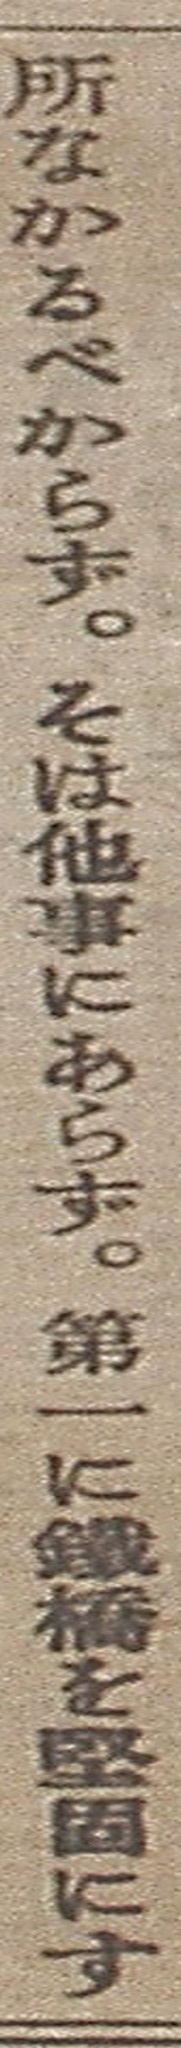所なかるべからず。そは他事にあらず。第一に鉄橋を堅固にす
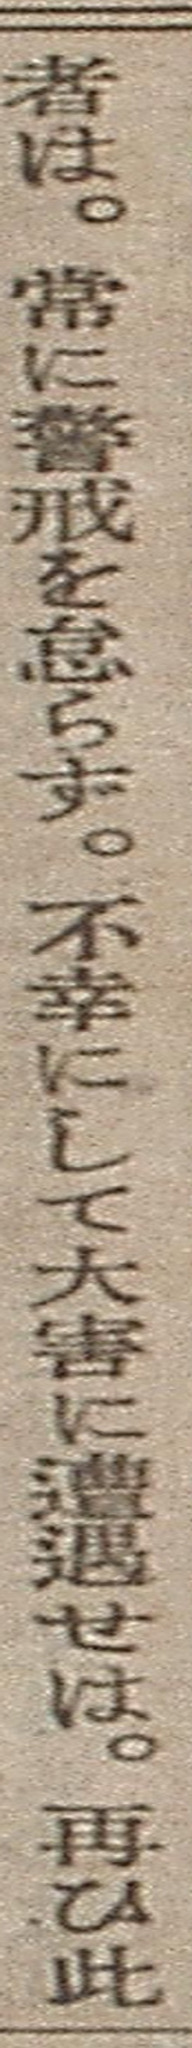者は。常に警戒を怠らず。不幸にして大害に遭遇せは。再ひ此
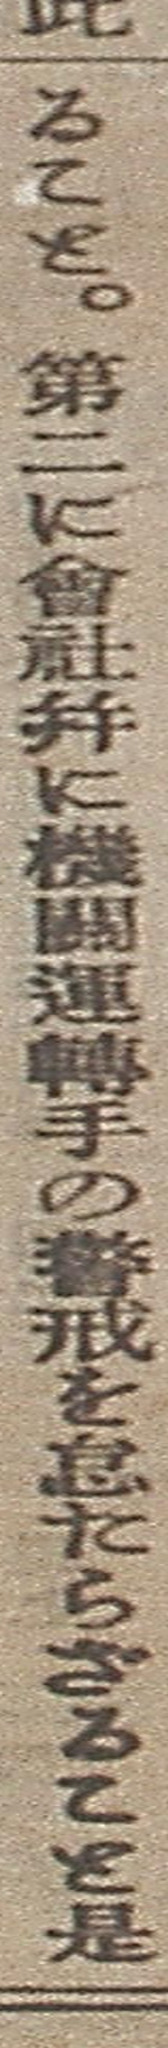ること。第二に会社并に機関運転手の警戒を怠たらざること是
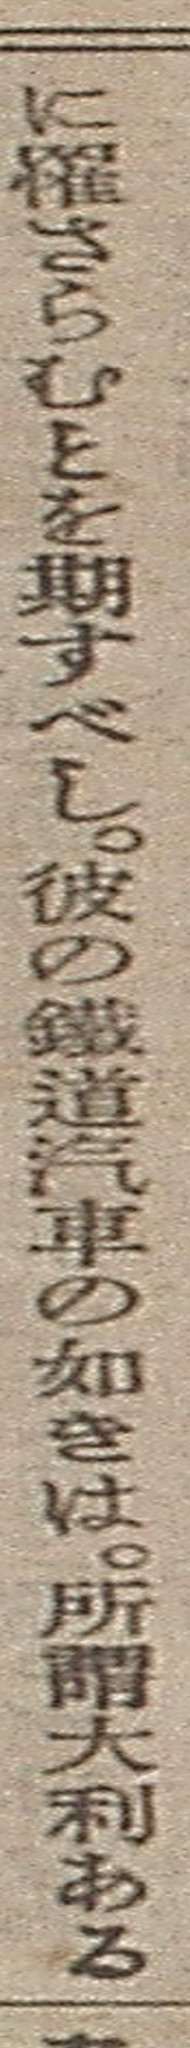に罹さらむことを期すべし。彼の鉄道汽車の如きは。所謂大利ある
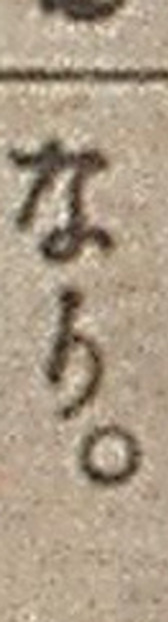なり。
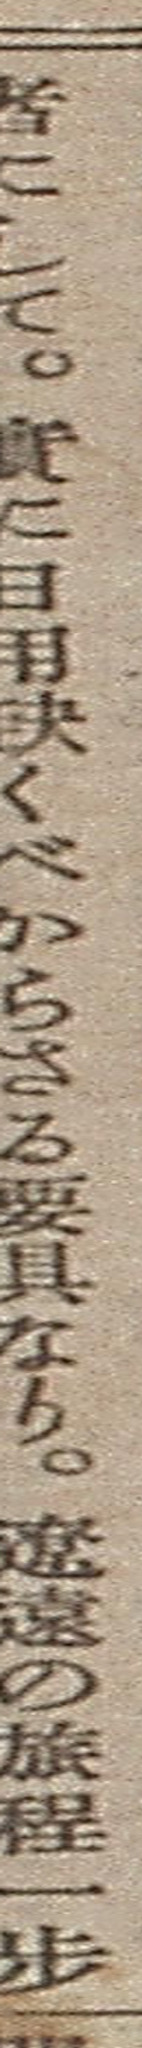者にして。実に日用欠くべからさる要具なり。遼遠の旅程一歩
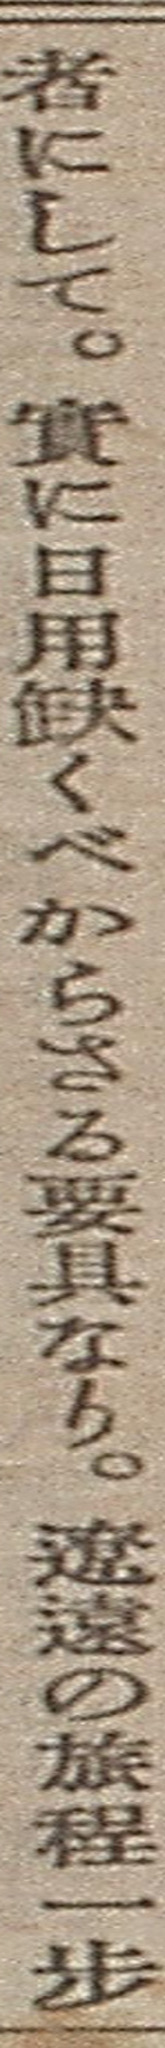者にして。実に日用欠くべからさる要具なり。遼遠の旅程一歩
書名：風俗畫報臨時増刊第百九十九號　明治三十二年十月各地災害圖會（前編之續）
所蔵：東京大学地震研究所図書室 Earthquake Research Institute Library, The University of Tokyo, JAPAN
